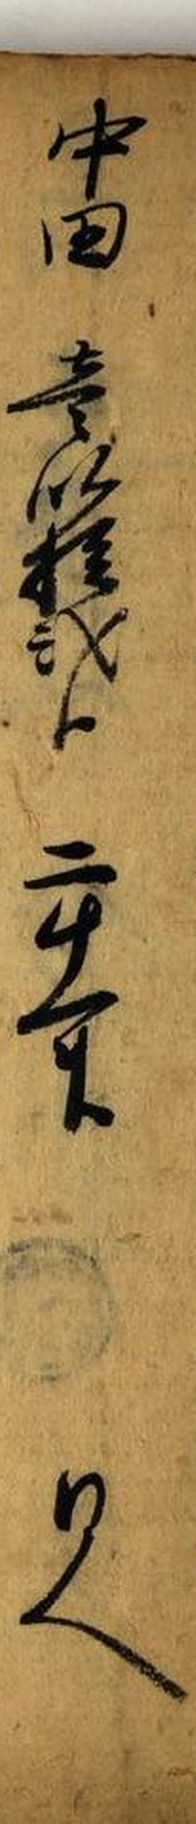中田壱畝拾弐分二斗一升同人
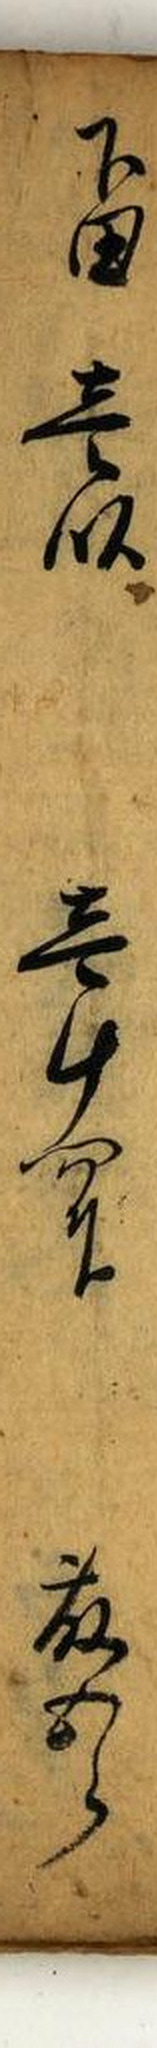下田壱畝壱斗四升藤五郎
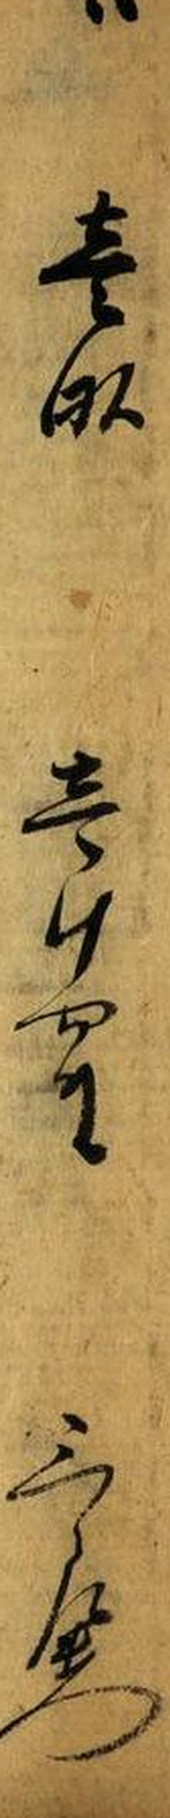同壱畝壱斗四升三郎左衛門
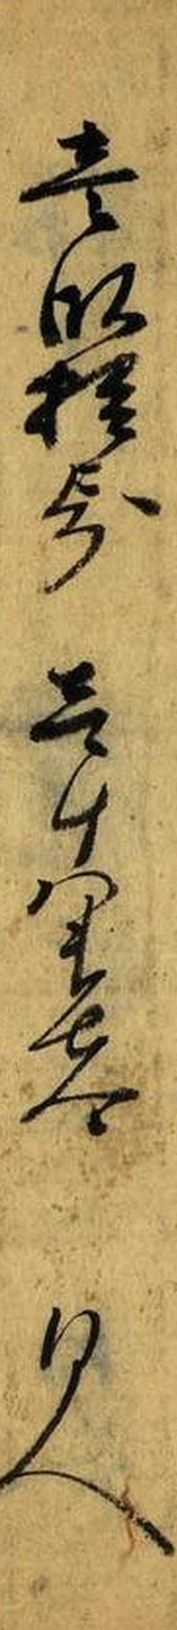同壱畝拾歩壱斗八升七合同人
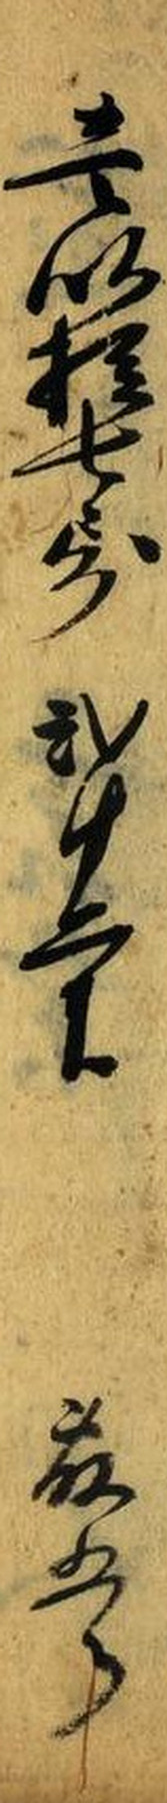同壱畝拾七歩弐斗二升藤五郎
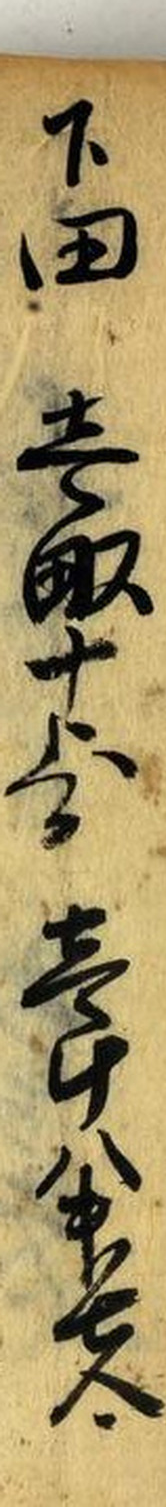下田一畝十歩壱斗八升七合同人
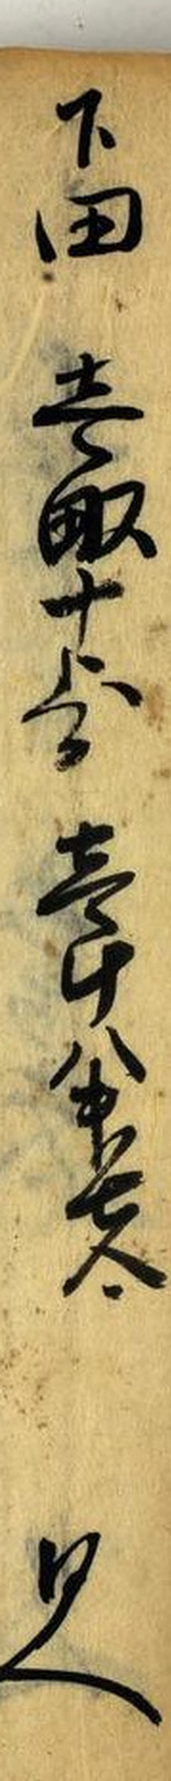下田一畝十歩壱斗八升七合同人
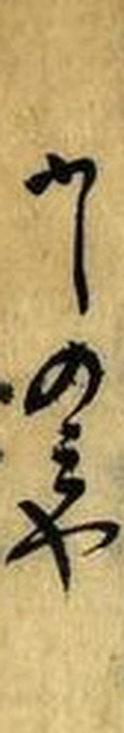かしのミや
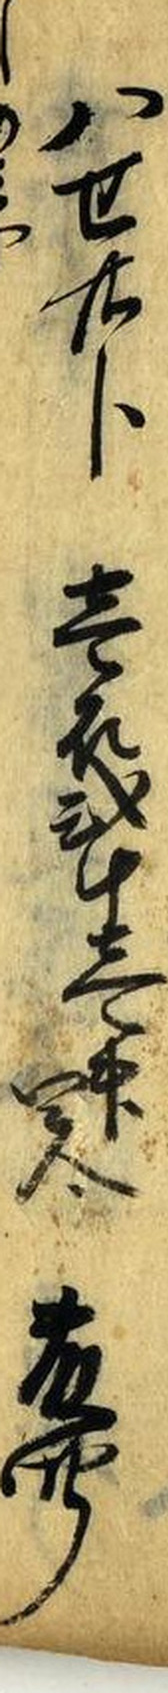同八セ廿分壱石弐斗壱升四合藤四郎
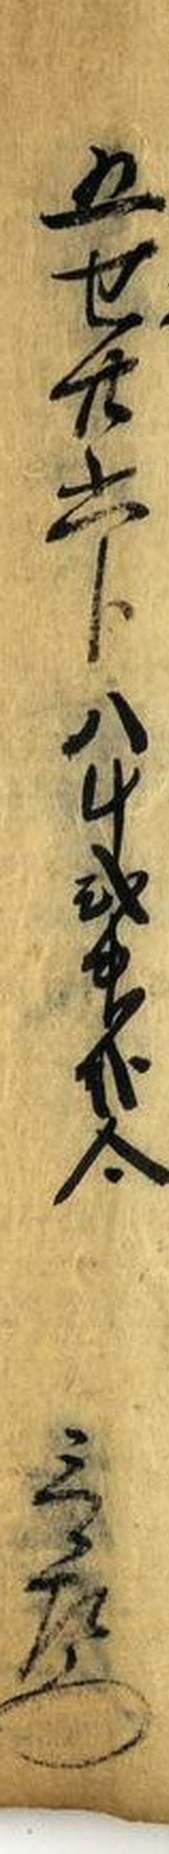同五セ廿六分八斗弐升弐合三郎左衛門
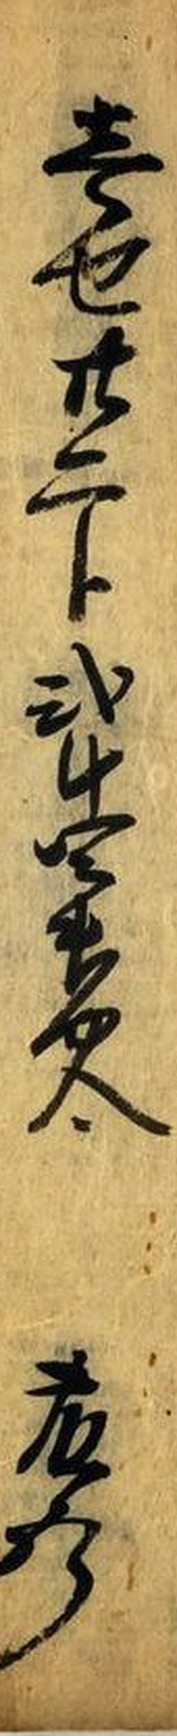同壱セ廿二分弐斗四升四合藤五郎

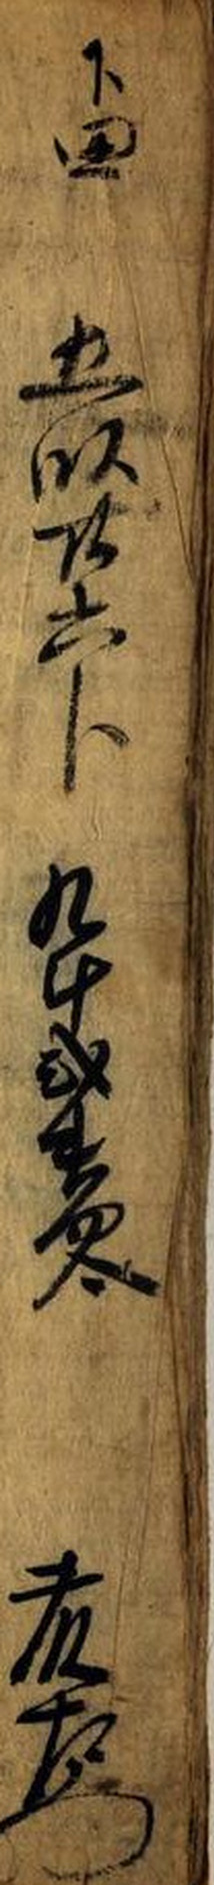下田五畝廿六分九斗弐升四合藤左衛門
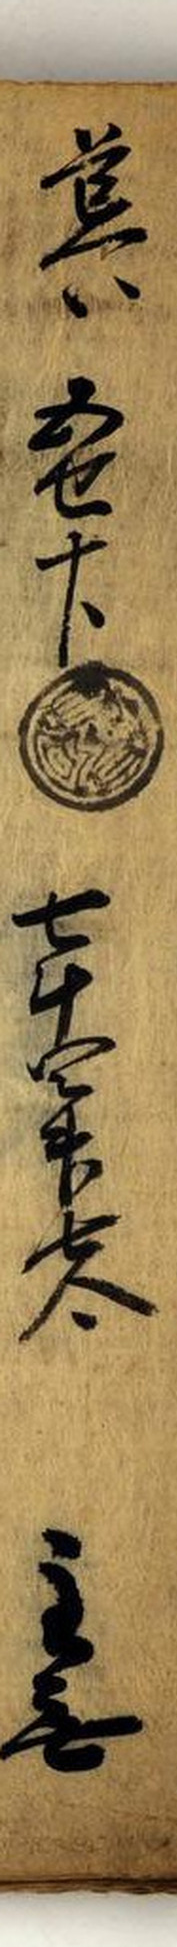荒同五セ十分㊞七斗四升七合主無
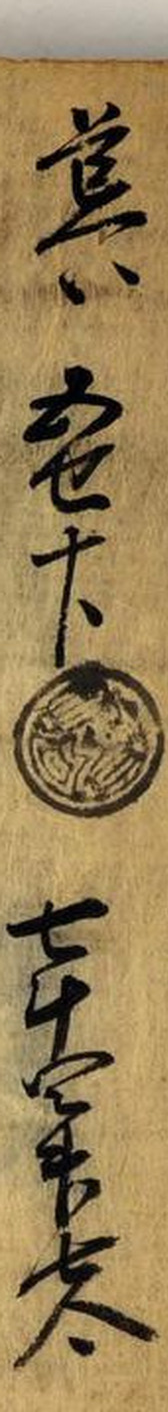荒同五セ十分㊞七斗四升七合主無
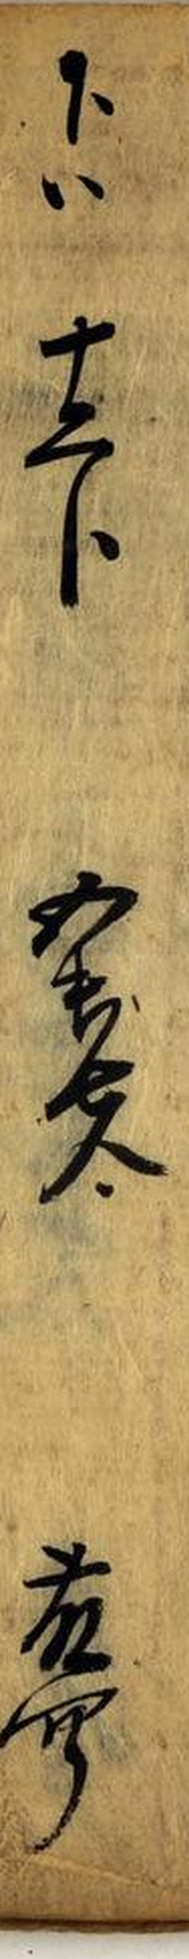下同十二分五升七合藤四郎
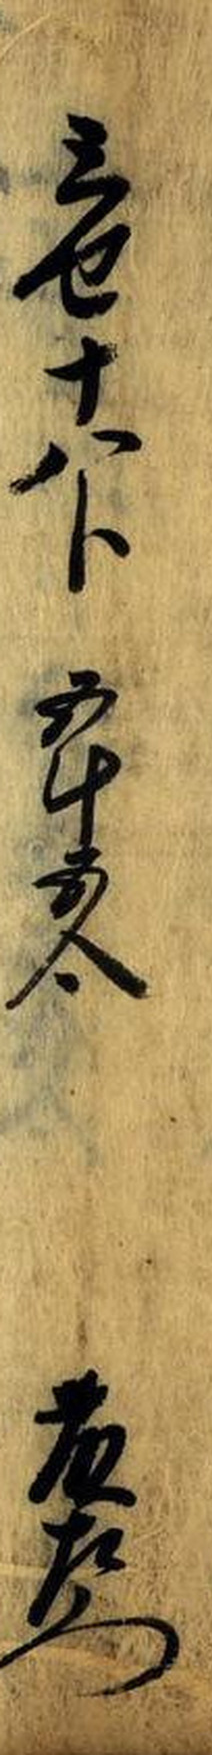同壱セ十八分五斗五合藤左衛門
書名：越前国西方内志津庄内本折村御検地帳
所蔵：福井県文書館 Fukui Prefectural Archives
